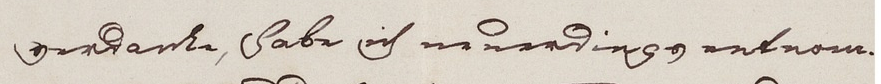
verdanke, habe ich neuerdings entnom-
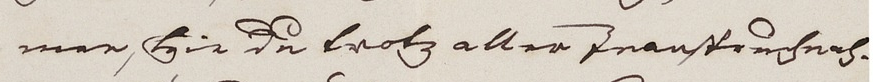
men, wie Du trotz aller Inanspruchnah-
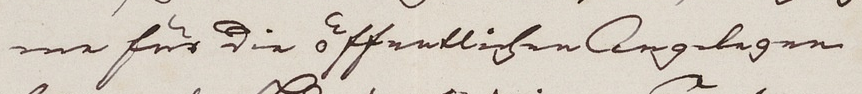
me für die öffentlichen Angelegen-
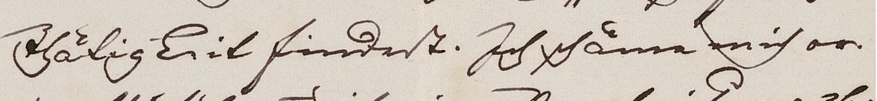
Thätigkeit findest. Ich schäme mich or-
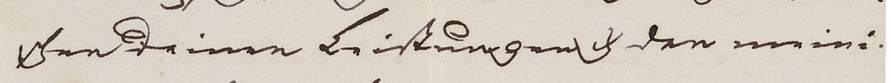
schen Deinen Leistungen & den meini-
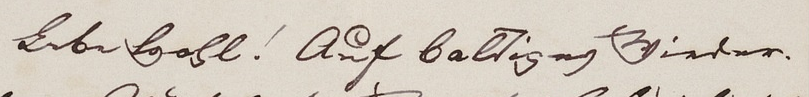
Lebe wohl! Auf baldiges Wieder-
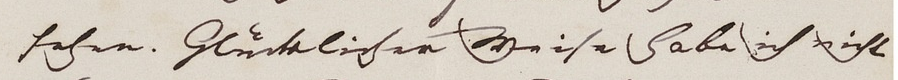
sehen. Glücklicher Weise habe ich nicht
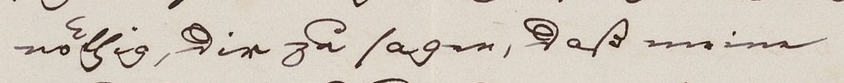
nöthig, Dir zu sagen, daß meine
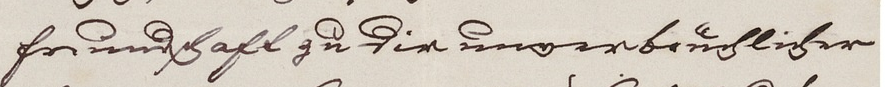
Freundschaft zu Dir unverbrüchlicher
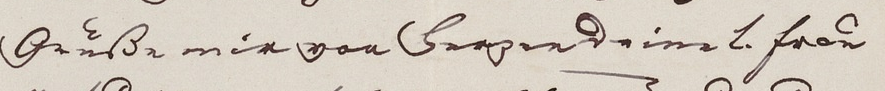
Grüße mir von herzen Deine l. Frau
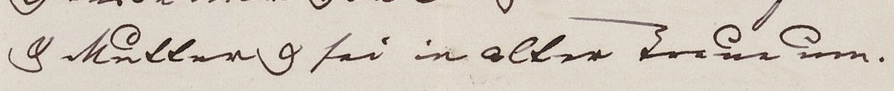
& Mutter & sei in alter Treue um-
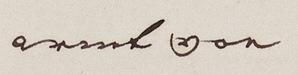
armt von
